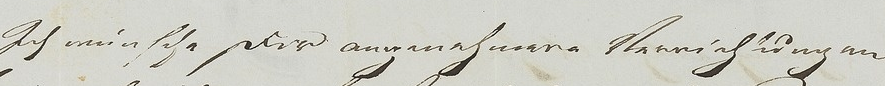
Ich wünsche Dir angenehmere Verrichtungen
